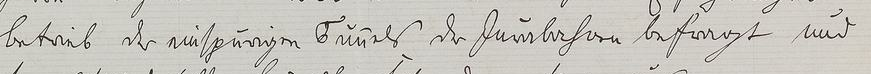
Betrieb der einspurigen Tunnels der Jurabahnen befragt und
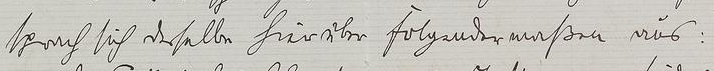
sprach sich derselbe hierüber folgendermaßen aus:
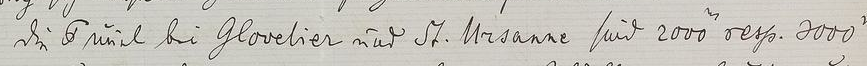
Die Tunnel bei Glovelier und St. Ursanne sind 2000m resp. 3000m
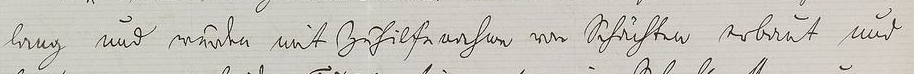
lang und wurden mit Zuhilfenahme von Schächten erbaut und
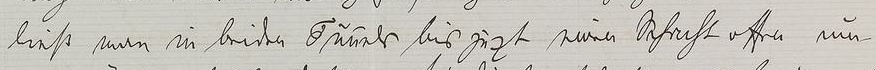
ließ man in beiden Tunnels bis jezt einen Schacht offen um –
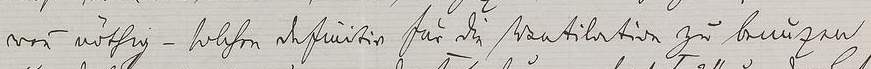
wenn nöthig – solchen definitiv für die Ventilation zu benuzen
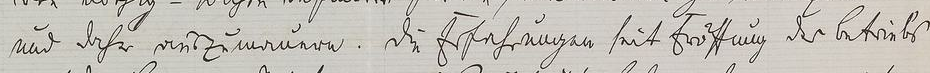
und daher auszumauern. Die Erfahrungen seit Eröffnung des Betriebs
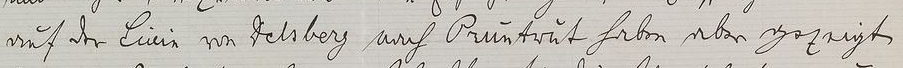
auf der Linie von Delsberg nach Pruntrut haben aber gezeigt,
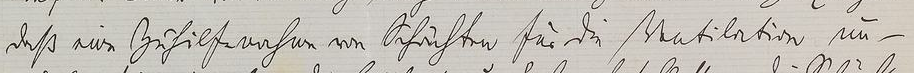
daß eine Zuhilfenahme von Schächten für die Ventilation un-
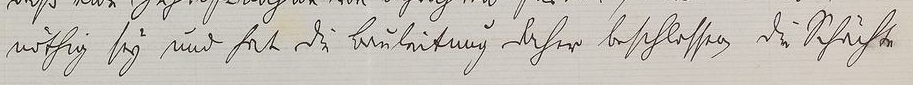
nöthig sey und hat die Bauleitung daher beschlossen, die Schächte
